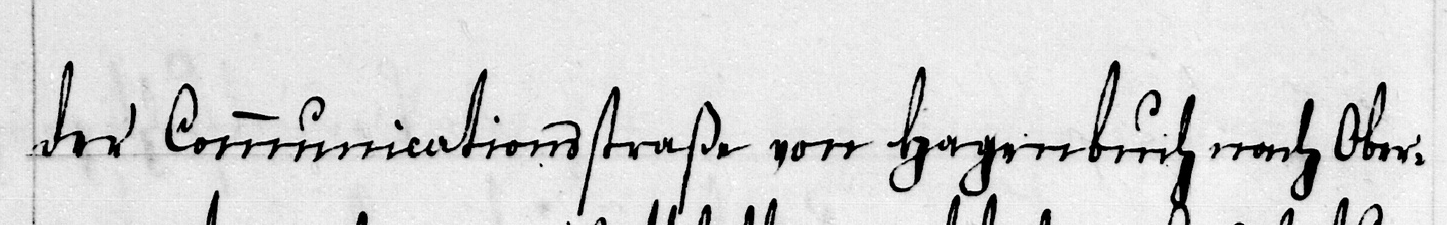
der Communicationsstraße von Hagenbuch nach Ober¬
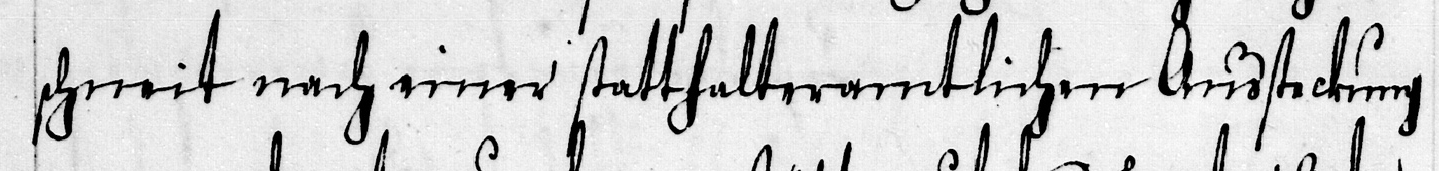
schneit nach einer statthalteramtlichen Aussteckung
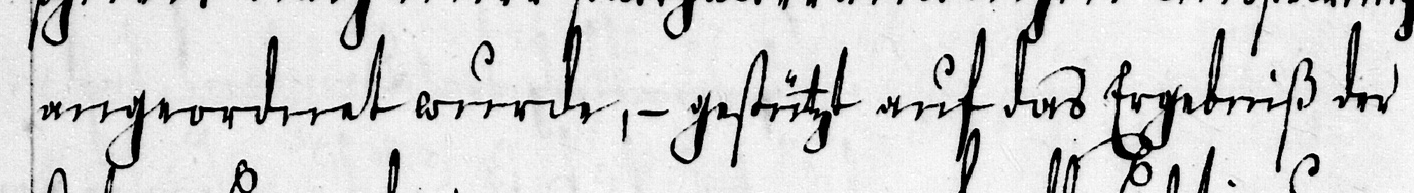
angeordnet wurde, – gestützt auf das Ergebniß der
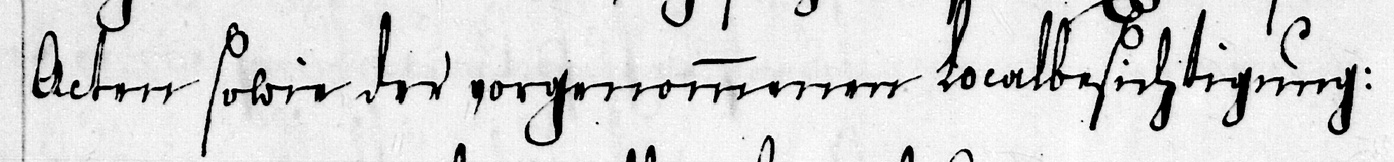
Acten sowie der vorgenommenen Localbesichtigung:
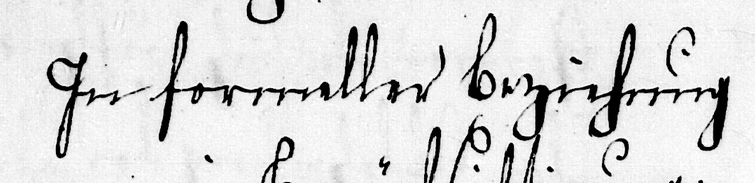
In formeller Beziehung
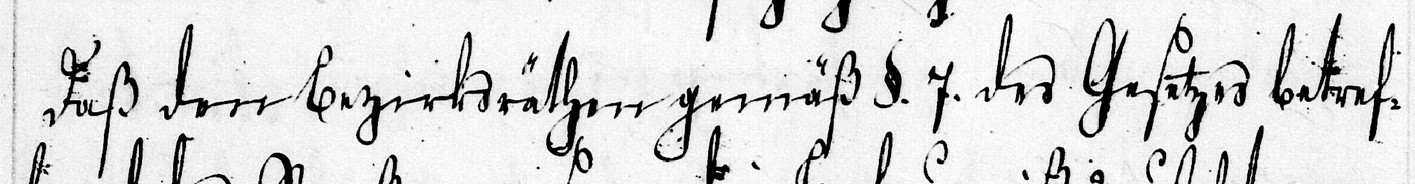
Daß den Bezirksräthen gemäß §. 7. des Gesetzes betref¬
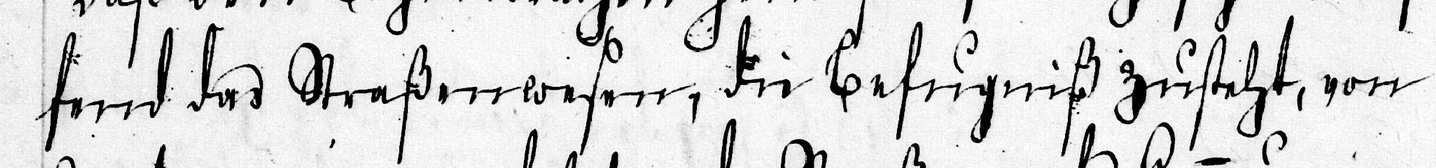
fend das Straßenwesen, die Befugniß zusteht, von
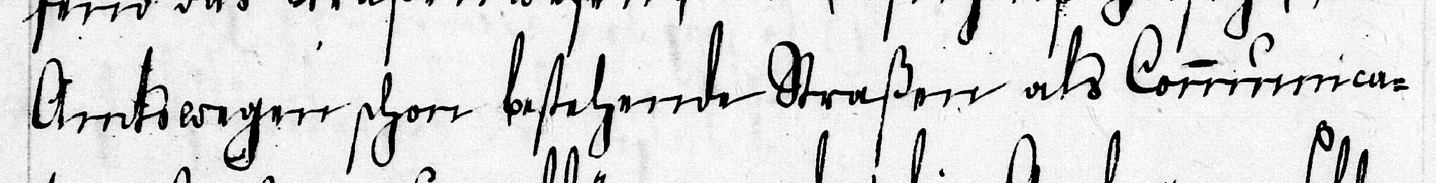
Amtswegen schon bestehende Straßen als Communica¬
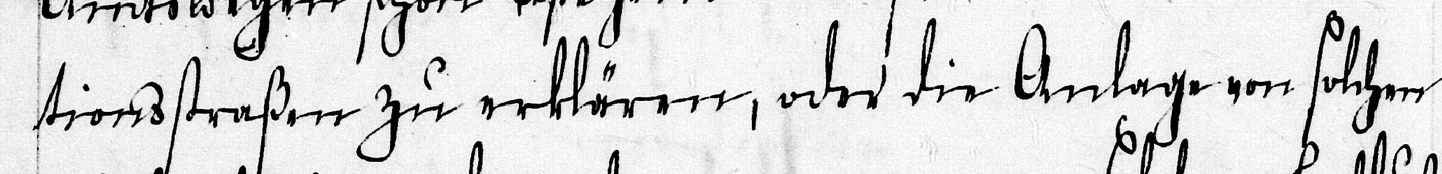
tionsstraßen zu erklären, oder die Anlage von solchen
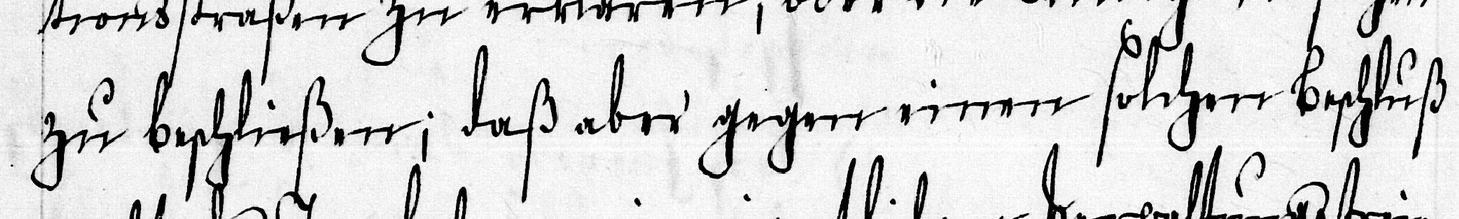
zu beschließen; daß aber gegen einen solchen Beschluß
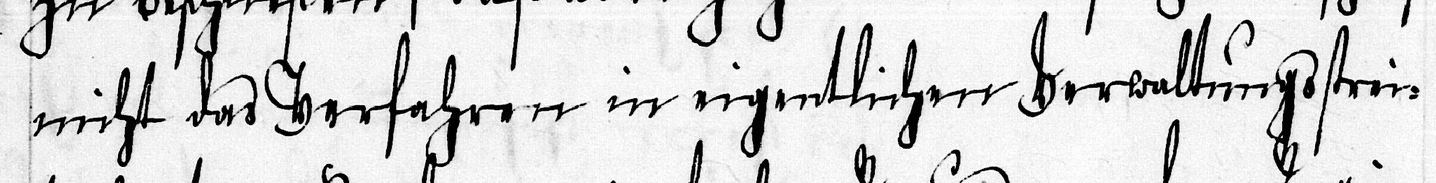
nicht das Verfahren in eigentlichen Verwaltungsstrei¬
